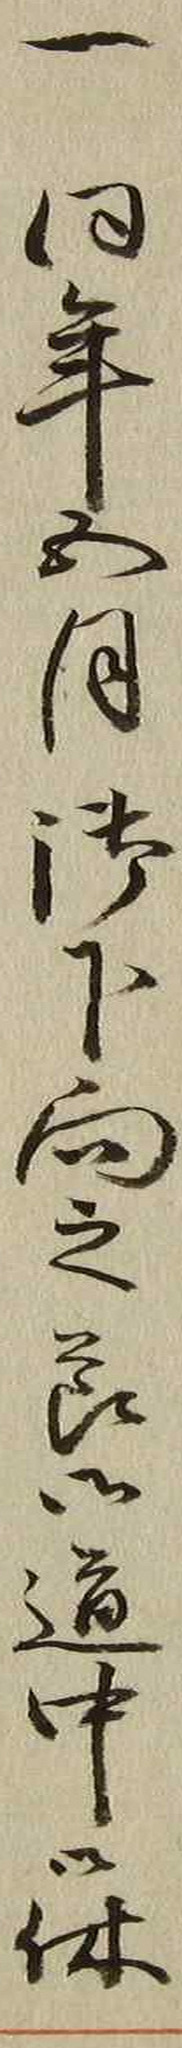一同年五月御下向之節御道中御休
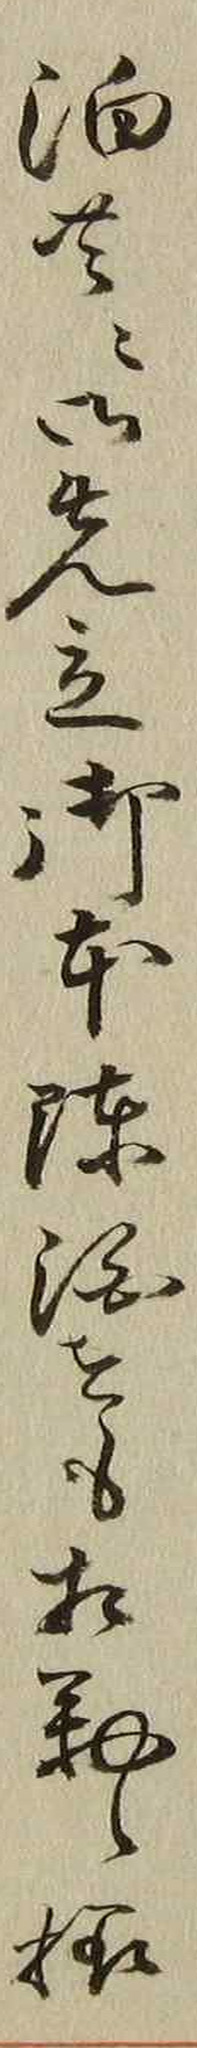泊共ニ御先立御本陣泊をも相勤候様
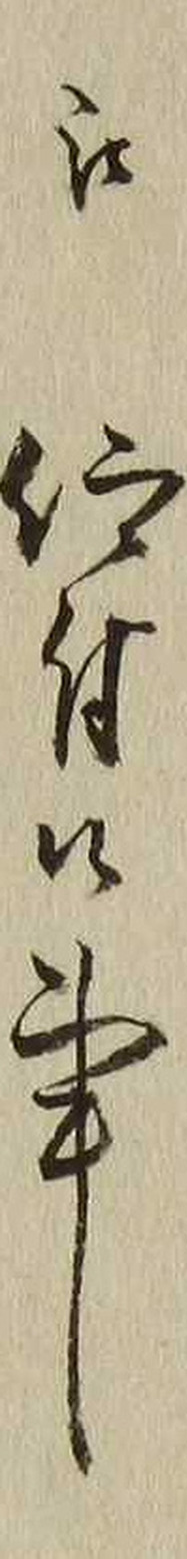被仰付候事
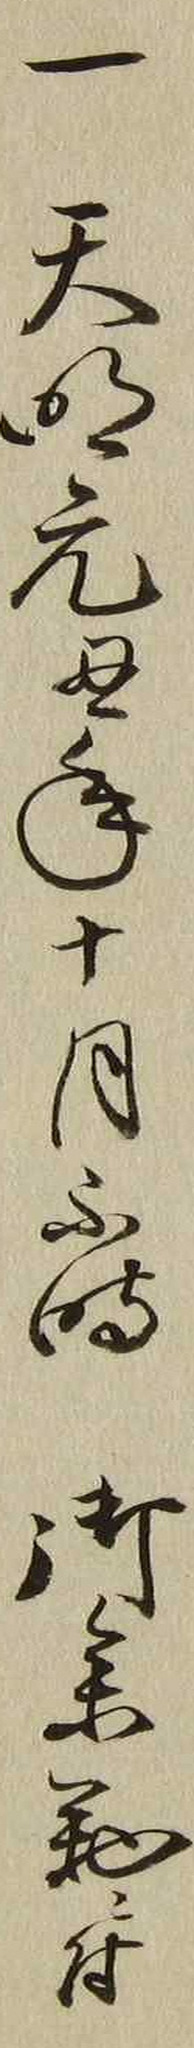一天明元丑年十月不時御参勤ニ付
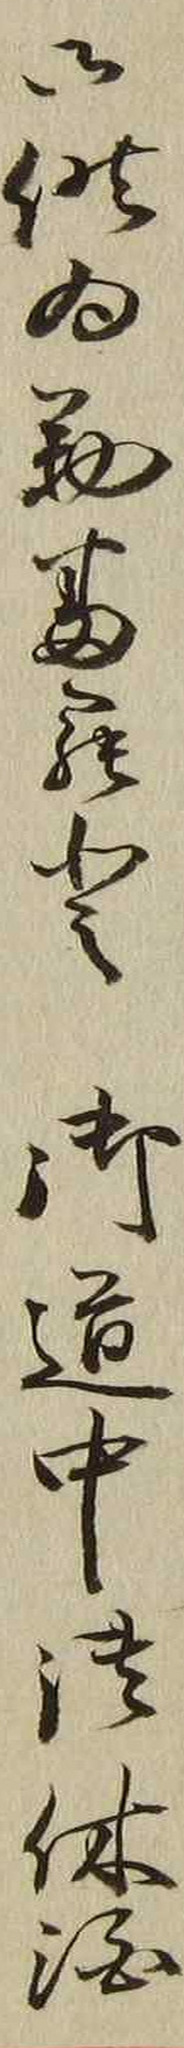御供為勤番罷登御道中御休泊
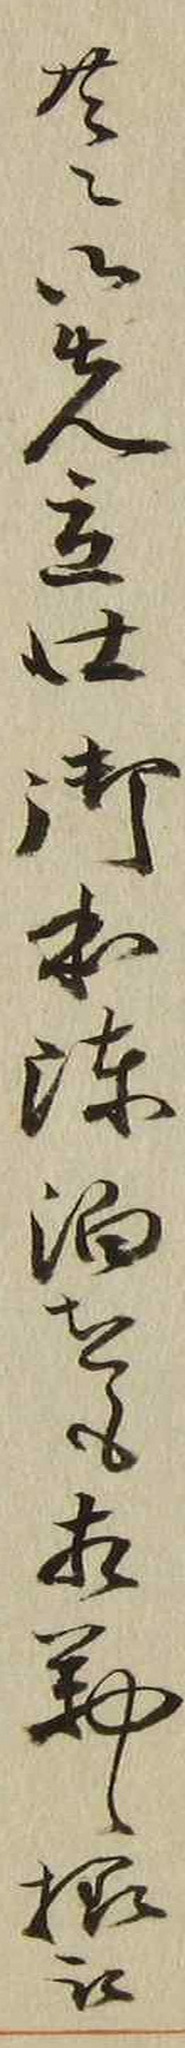共ニ御先立仕御本陣泊をも相勤候様被
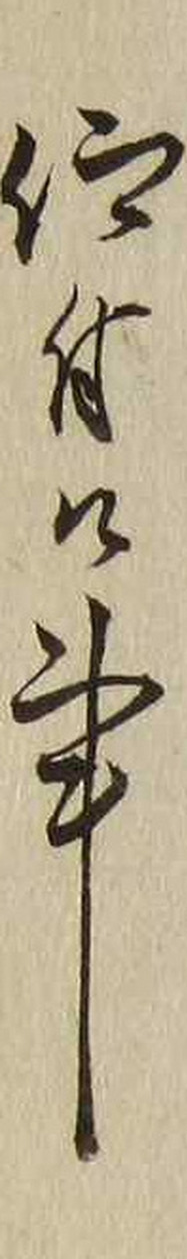仰付候事
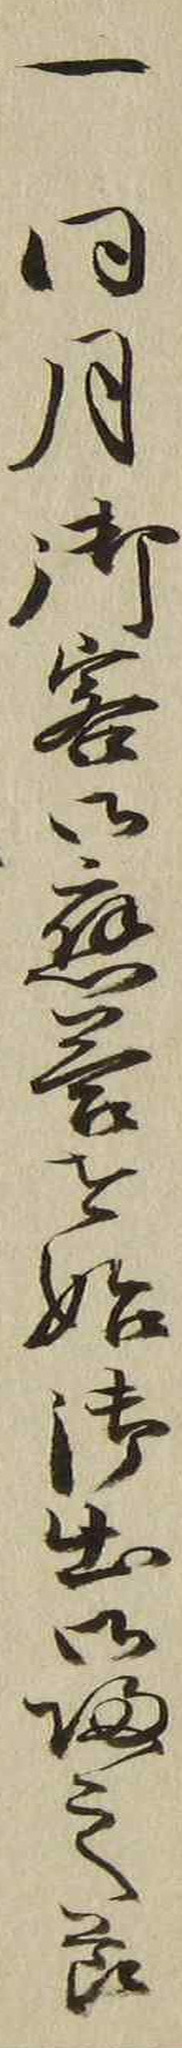一同月御客御応答を始御出御帰之節
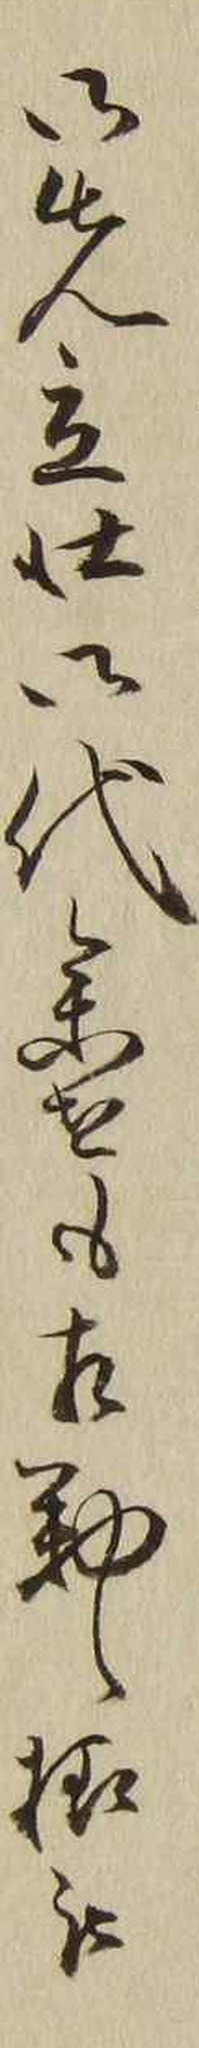御先立仕御代参をも相勤候様被

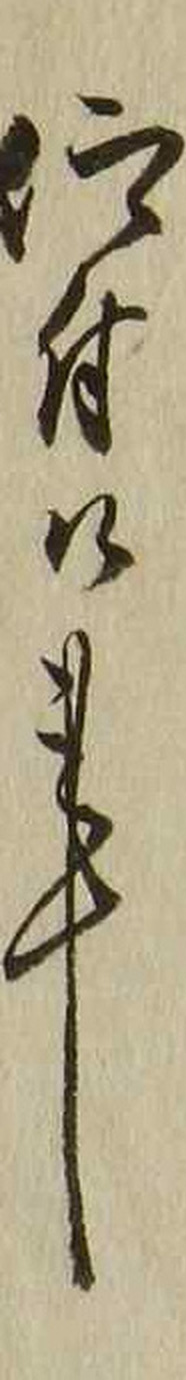仰付候事
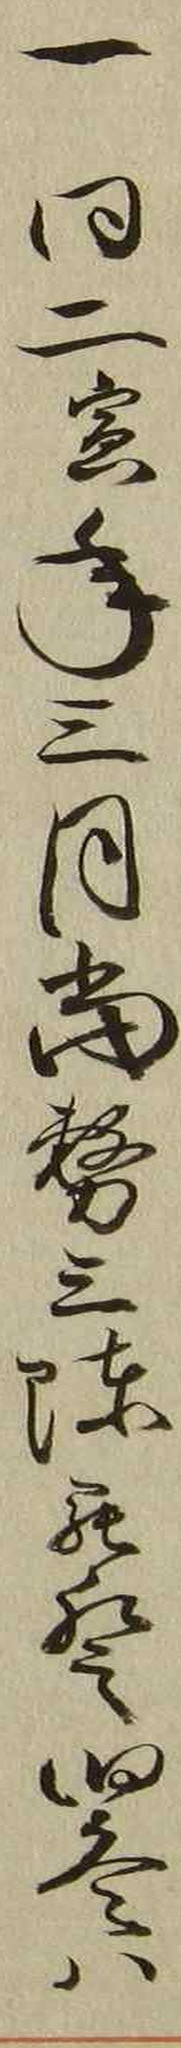一同二寅年三月当務三陣罷登旧冬ハ
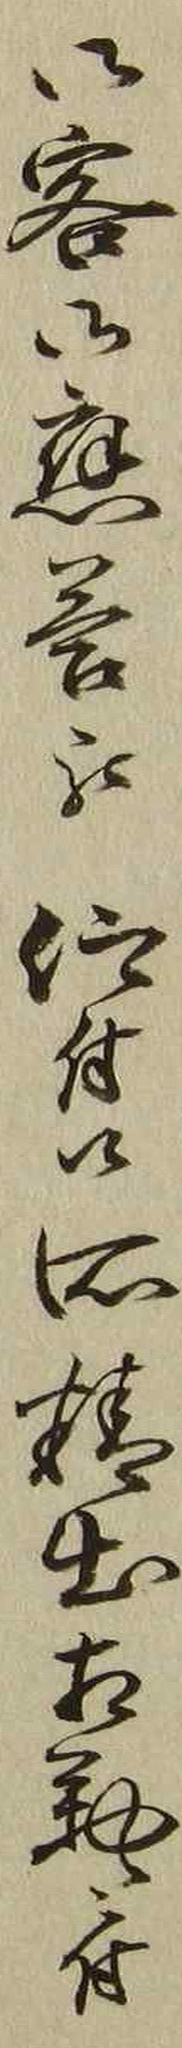御客御応答被仰付候所精出相勤候ニ付
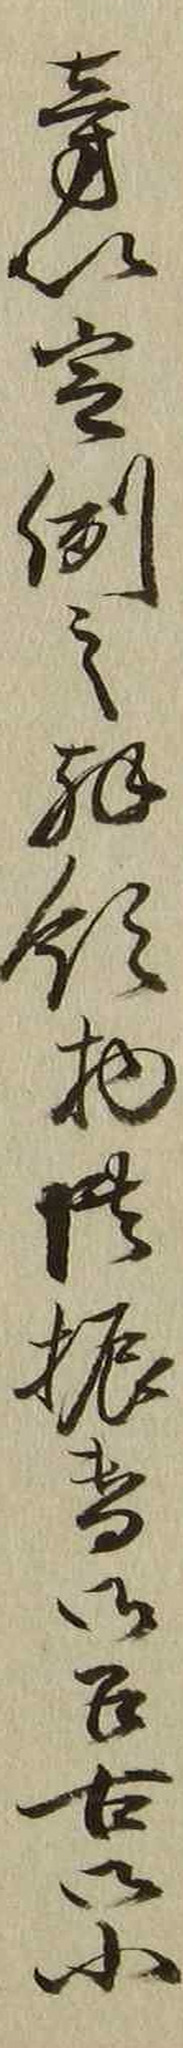旁以定例之拝領物御振替御召古御小
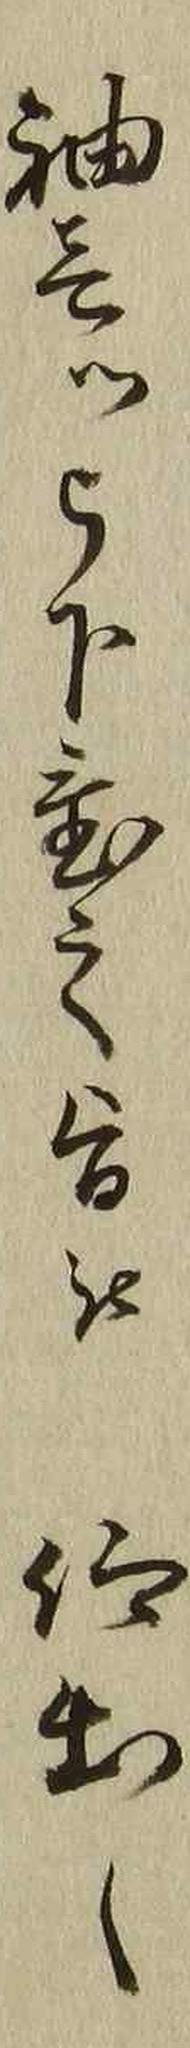袖壱ツ被下置之旨被仰出候
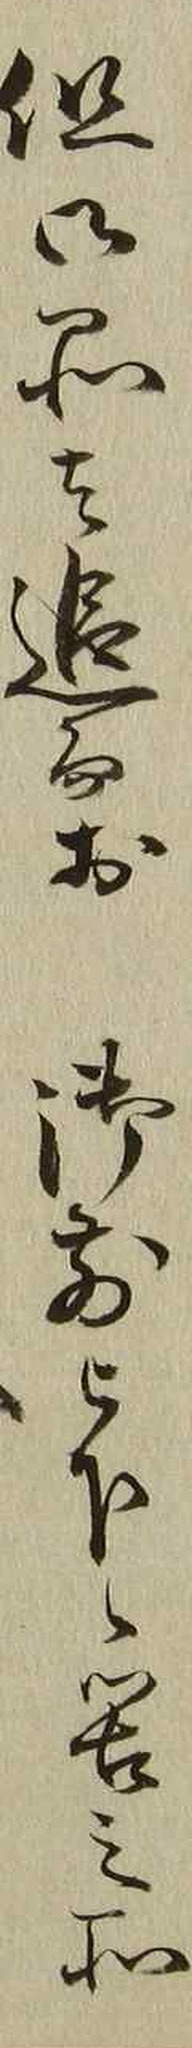但御品は追而於御前被下候筈之所
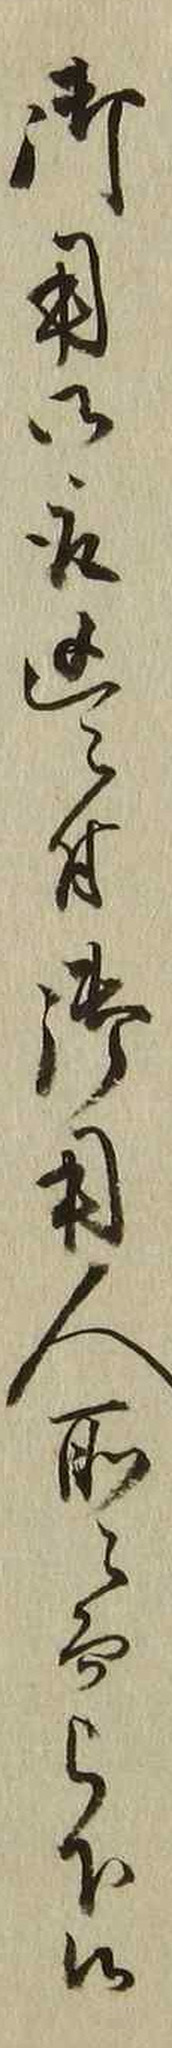御用御取込ニ付御用人所ニ而被下候
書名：諸士系譜　巻之60　と之部3
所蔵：会津若松市立会津図書館
